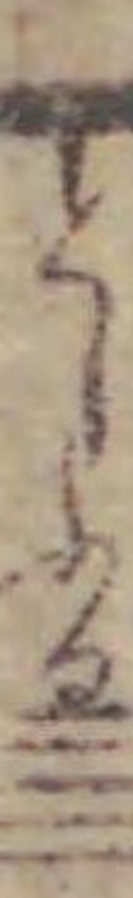としふる
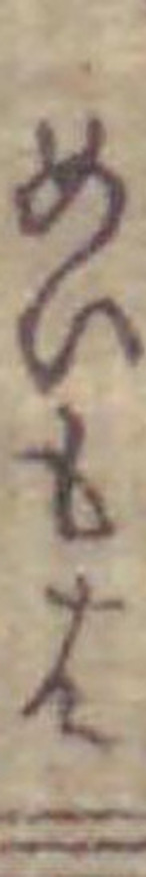めいもは
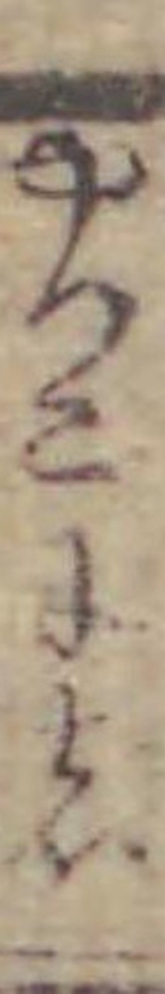やつこにし
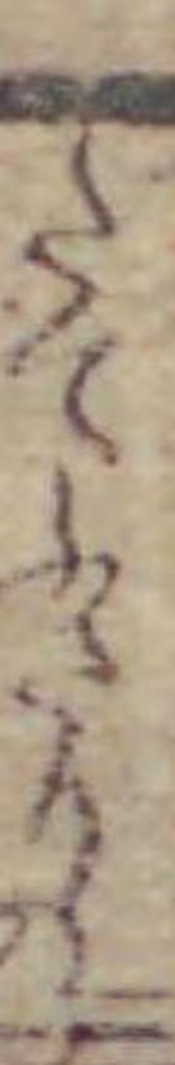たてふたりの
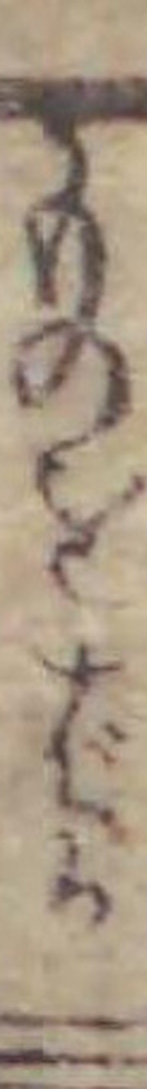ものをばか
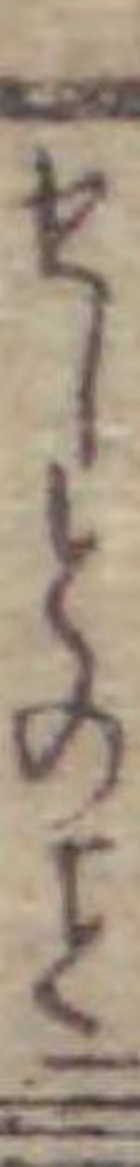せしとのこと
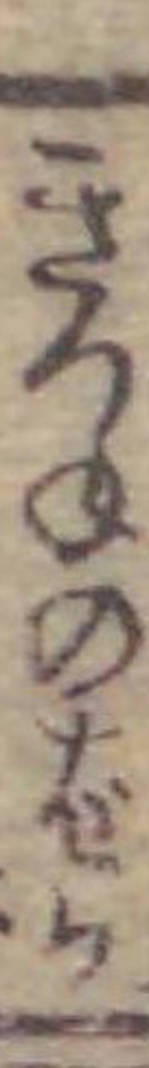きつねのばか
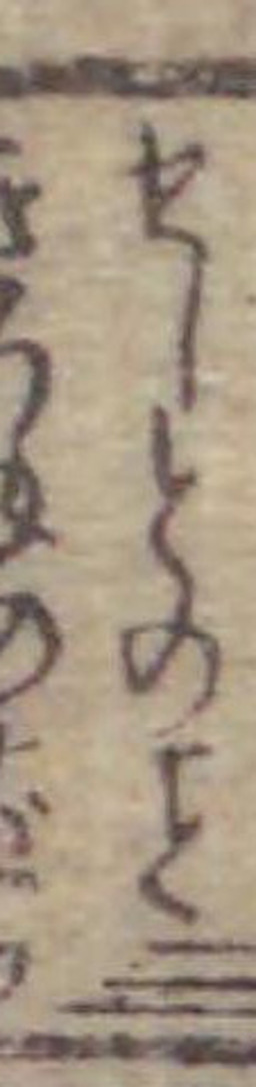きつねのばか
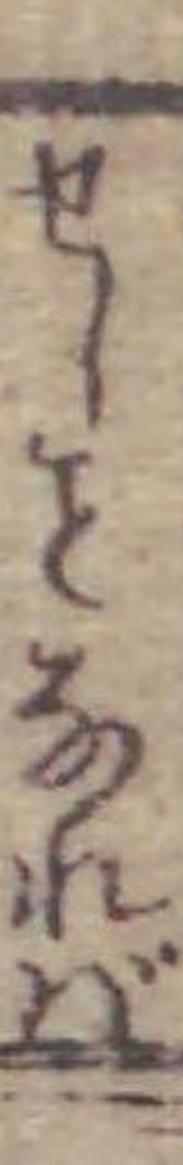せしことなれば
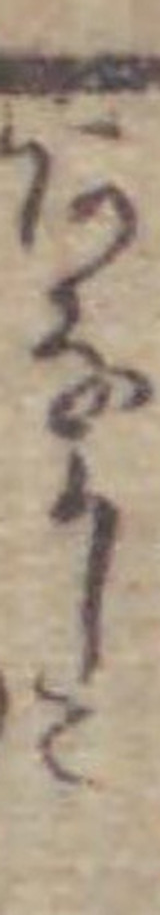あなかしこ
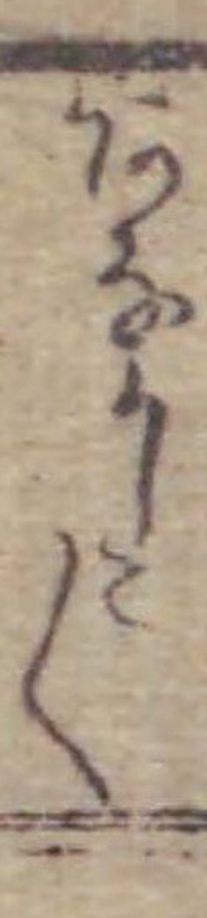あなかしこ
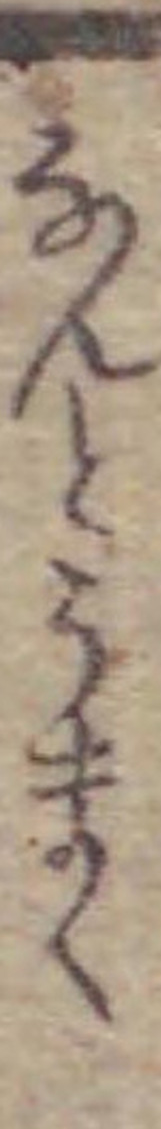なんとうまく
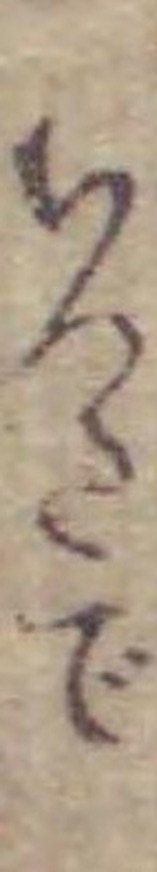いつたで
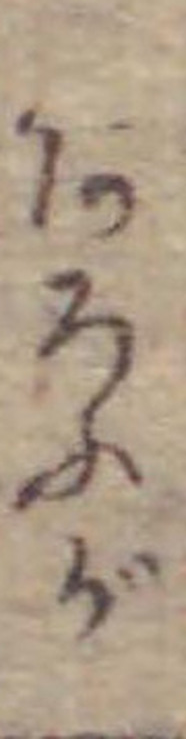あろふが
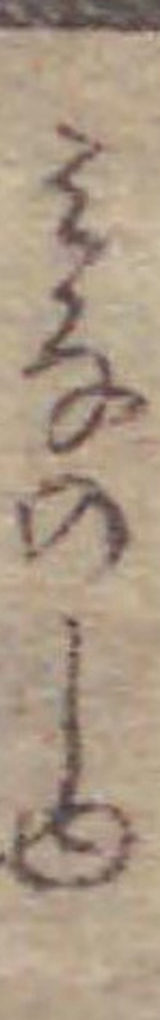みなのしゆ
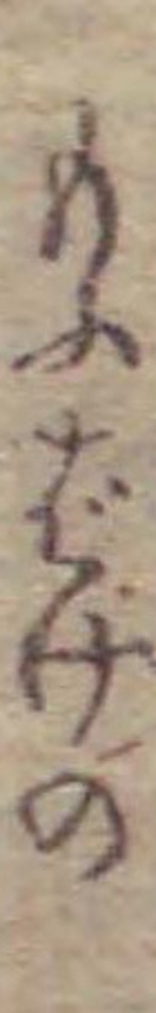もふばけの
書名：二日替 : 2巻
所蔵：国立国会図書館 National Diet Library, JAPAN
